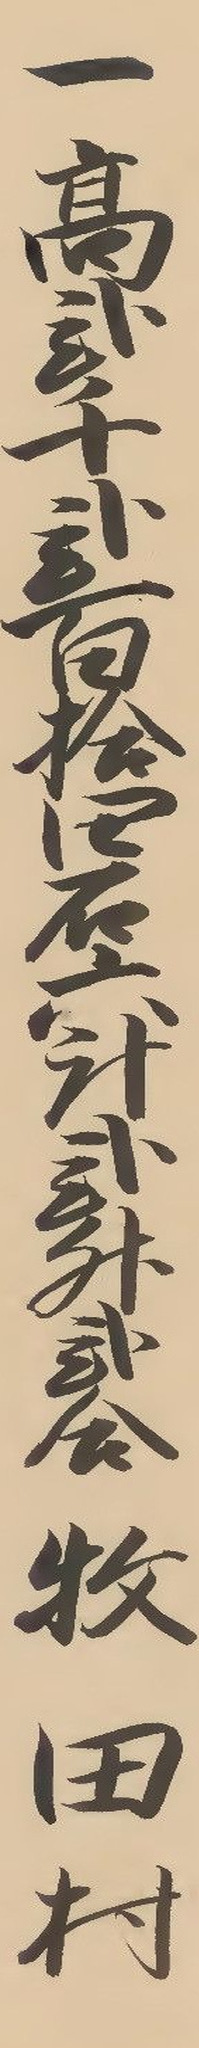一高弐千弐百拾四石六斗弐升弐合牧田村
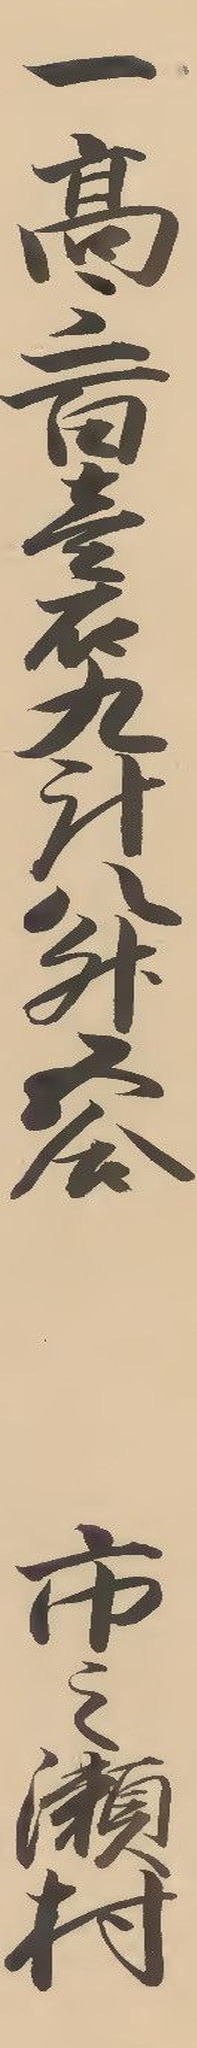一高三百壱石九斗八升五合市之瀬村
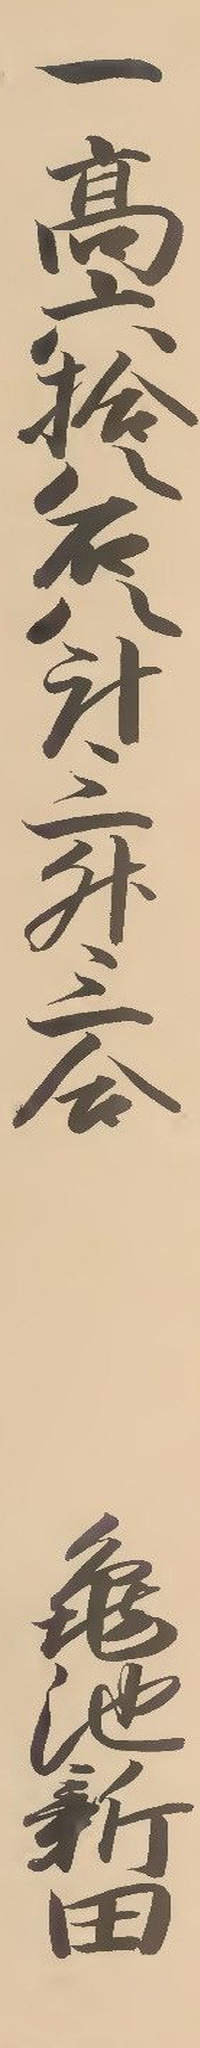一高六拾八石八斗三升三合亀池新田

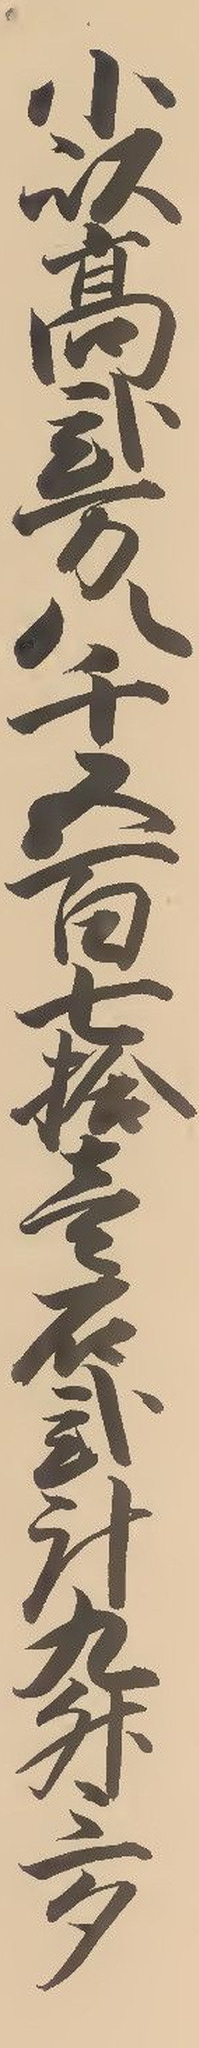小以高弐万八千五百七拾壱石弐斗九升三勺

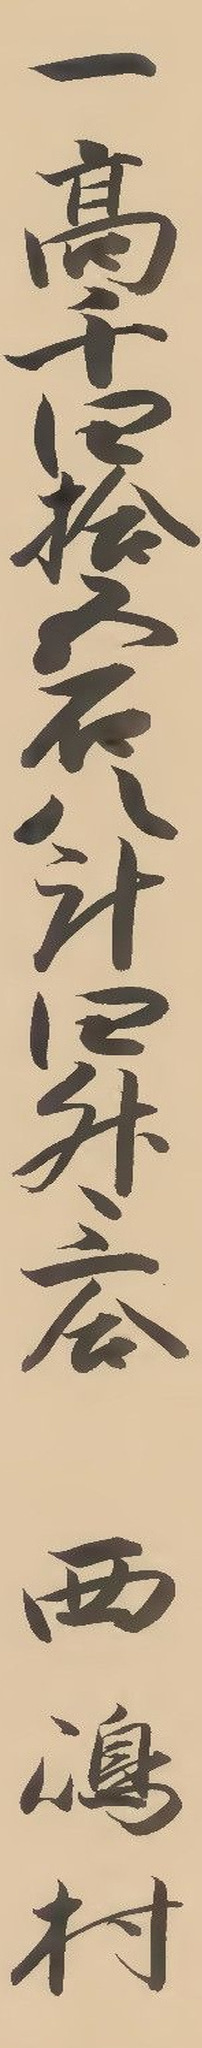一高千四拾五石八斗四升三合西島村
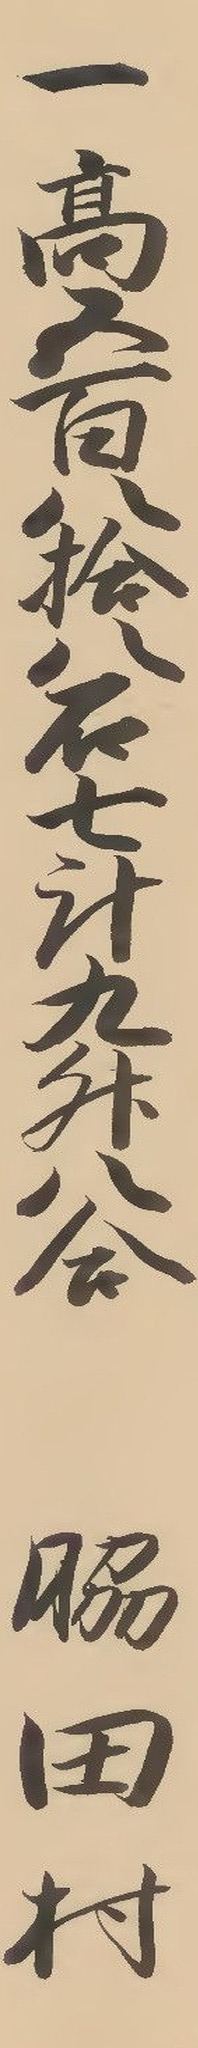一高五百八拾八石七斗九升八合脇田村
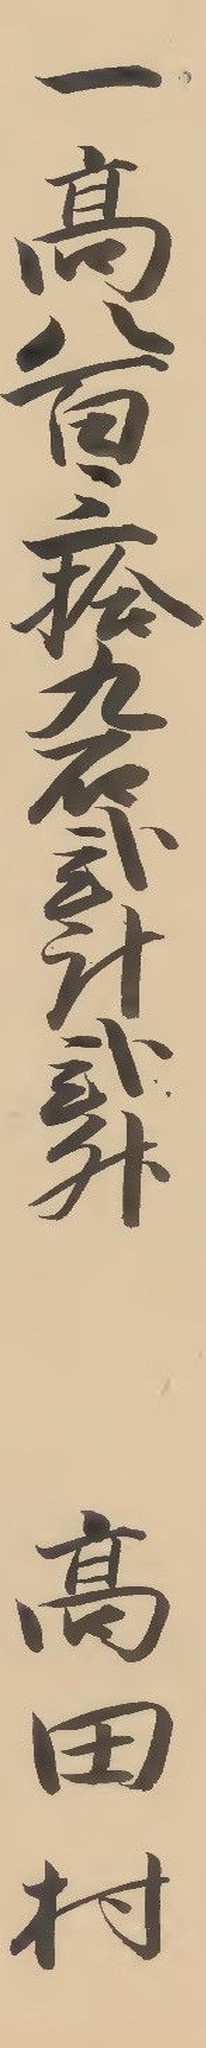一高八百三拾九石弐斗弐升高田村
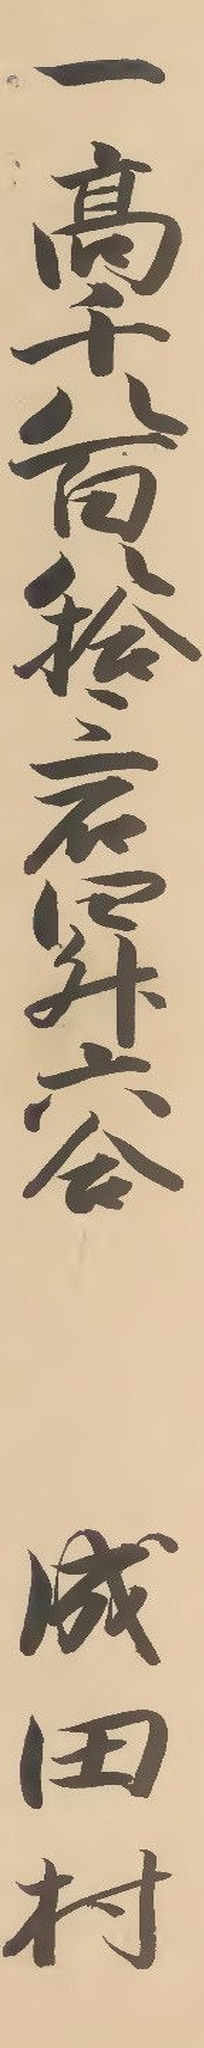一高千八百八拾三石四升六合成田村
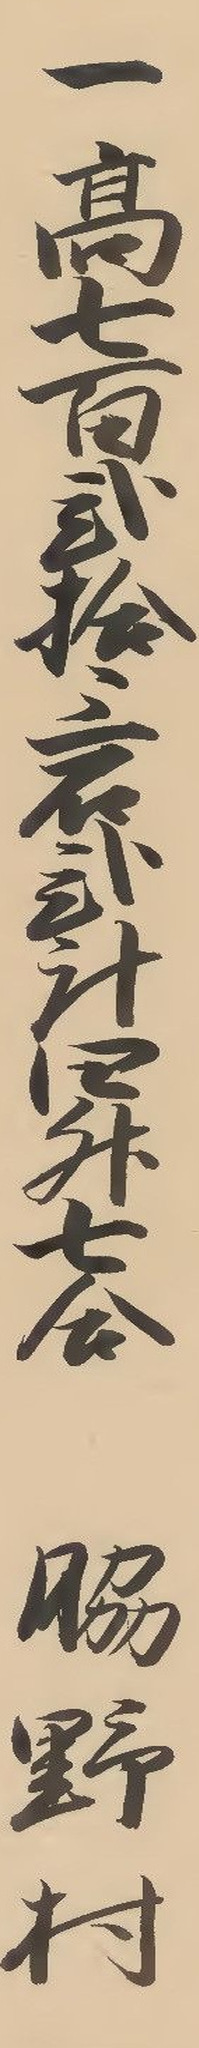一高七百弐拾三石弐斗四升七合脇野村
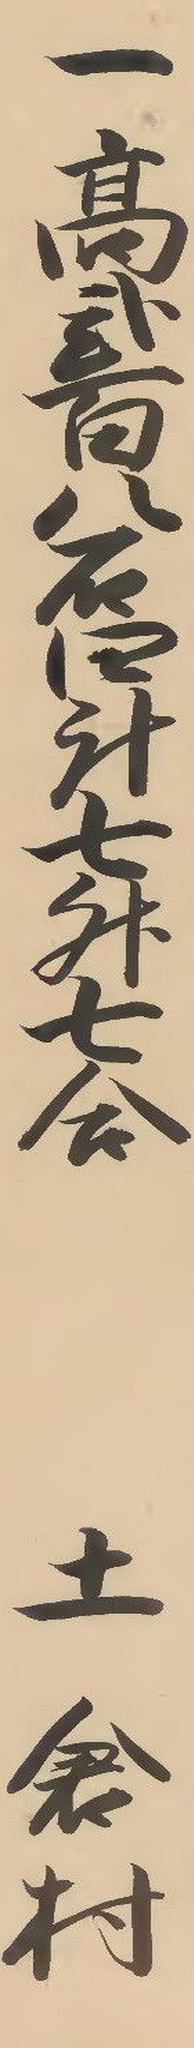一高弐百八石四斗七升七合土倉村

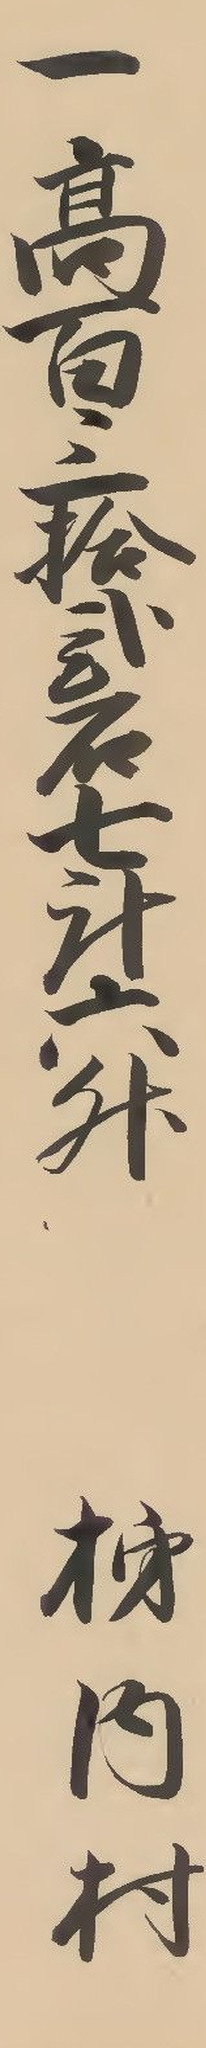一高百三拾弐石七斗六升柿内村
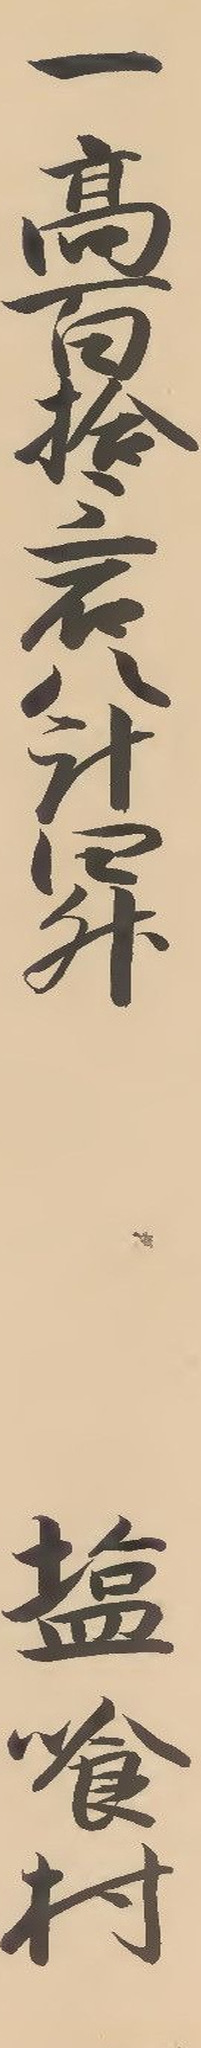一高百拾三石八斗四升塩喰村
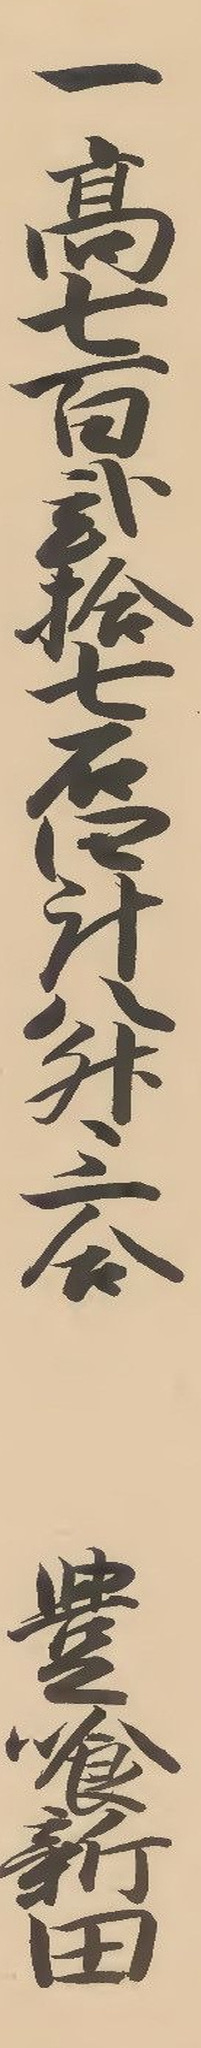一高七百弐拾七石四斗八升三合豊喰新田
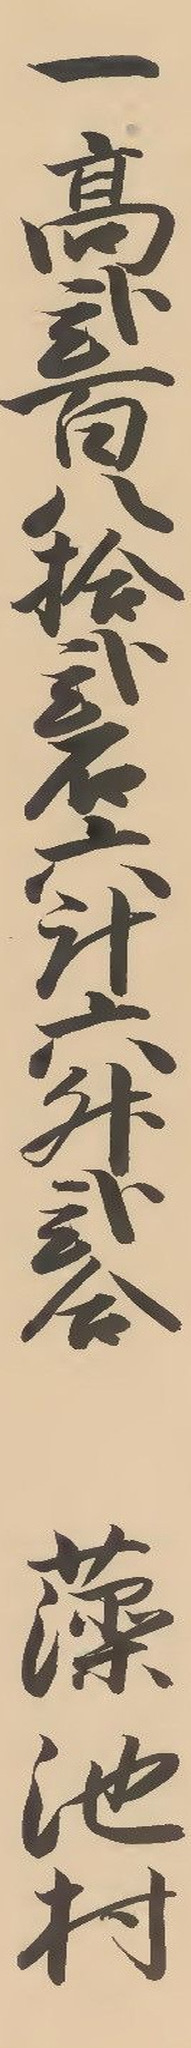一高弐百八拾弐石六斗六升弐合藻池村

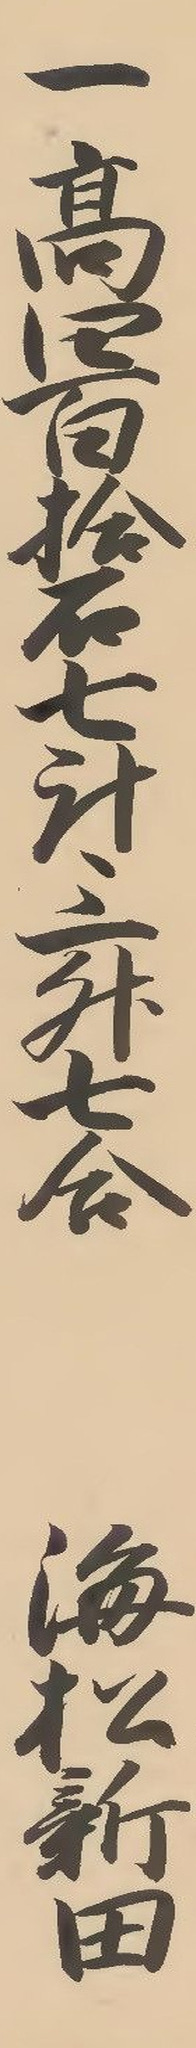一高四百拾石七斗三升七合海松新田
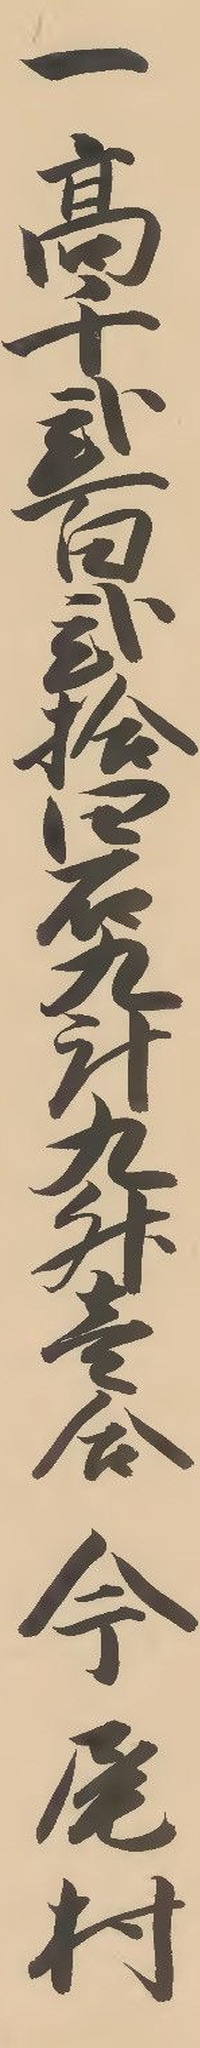一高千弐百弐拾四石九斗九升壱合今尾村
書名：美濃国郷帳
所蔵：国立公文書館 National Archives of Japan
